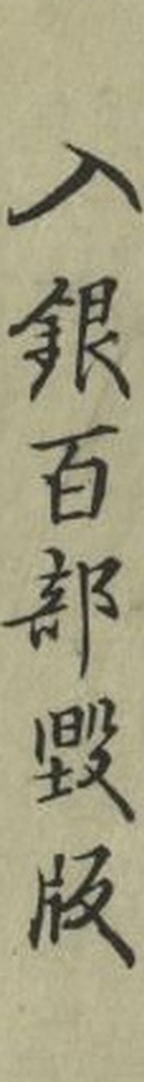入銀百部毀版
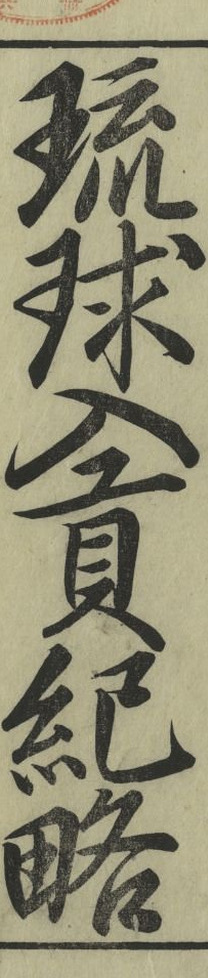琉球入貢紀略
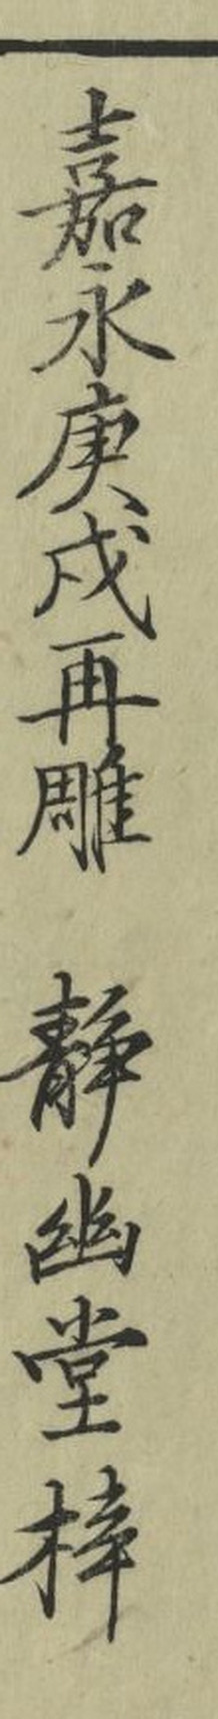嘉永庚戌再雕静幽堂梓
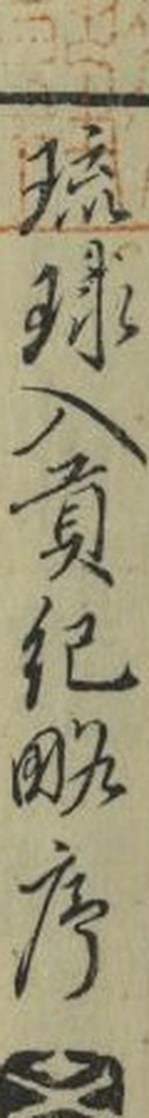琉球入貢紀略序
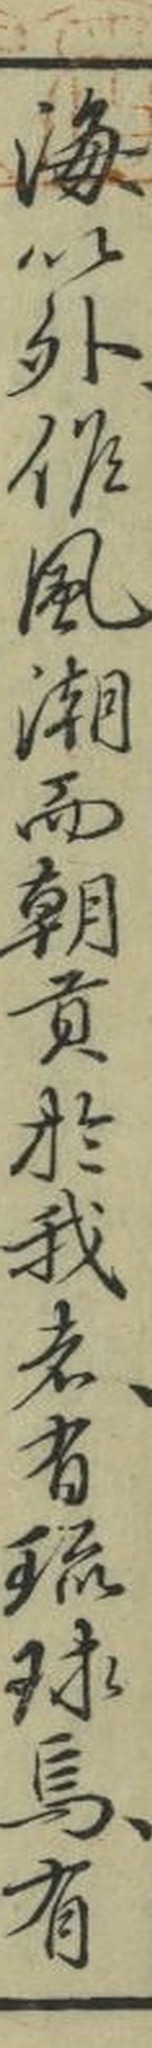海以外、作風潮而朝貢於我者、有琉球焉、有
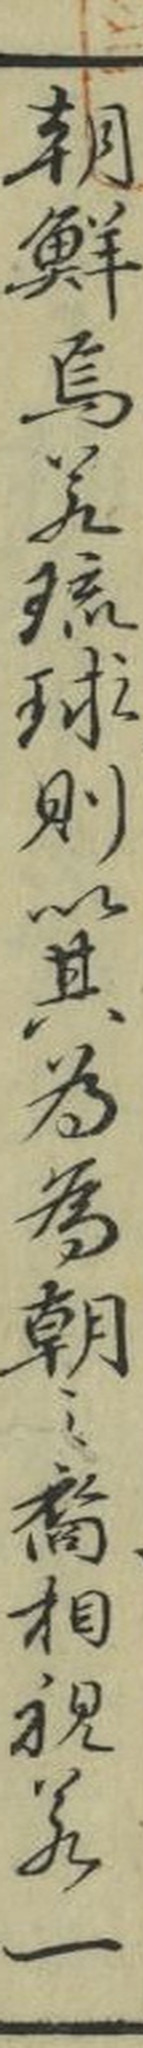朝鮮焉、若琉球、則以其為為朝之裔、相視若一
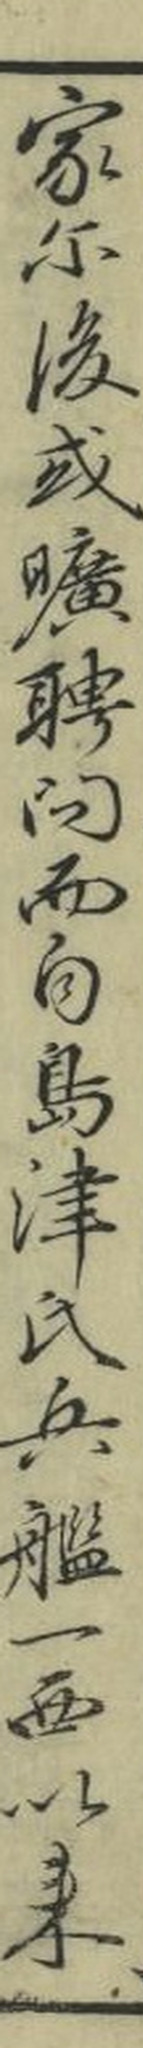家、尓後或曠聘問、而自島津氏兵艦一西以来、
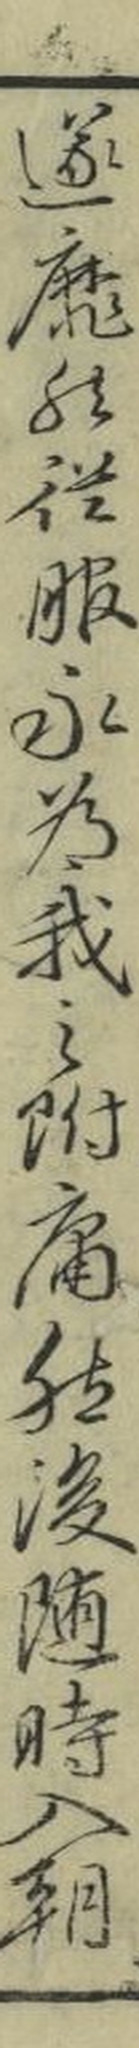遂靡然従服、永為我之附庸、然後随時入朝、
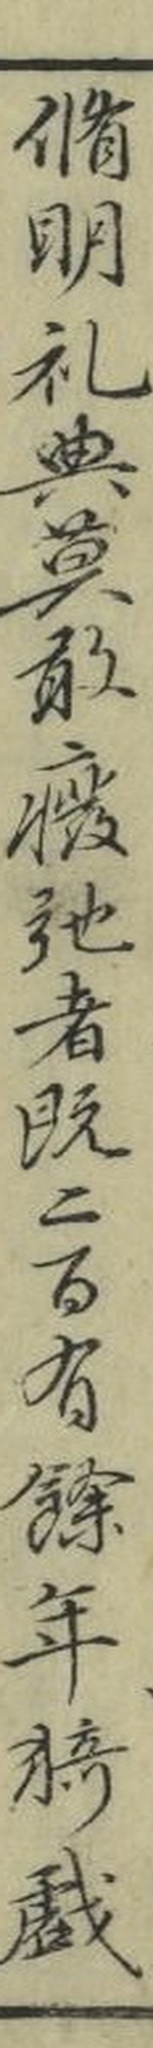脩明礼典、莫敢癈弛者、既二百有余年、猗戯
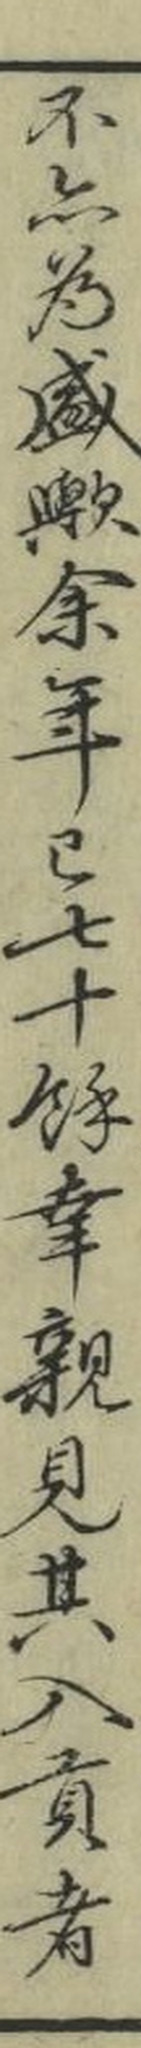不亦為盛歟、余年已七十余、幸親見其入貢者
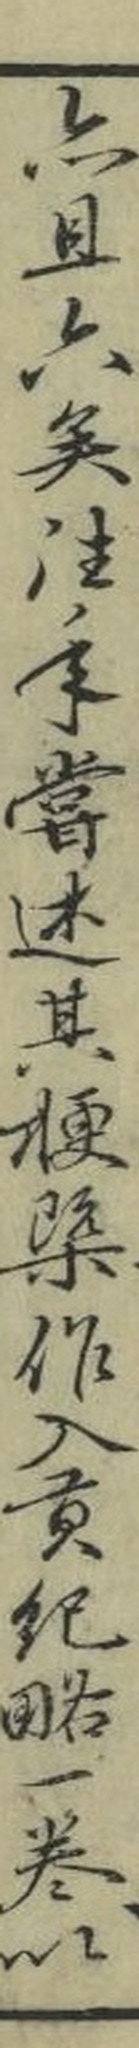亦且亦矣、往年嘗述其梗概、作入貢紀略一巻、以

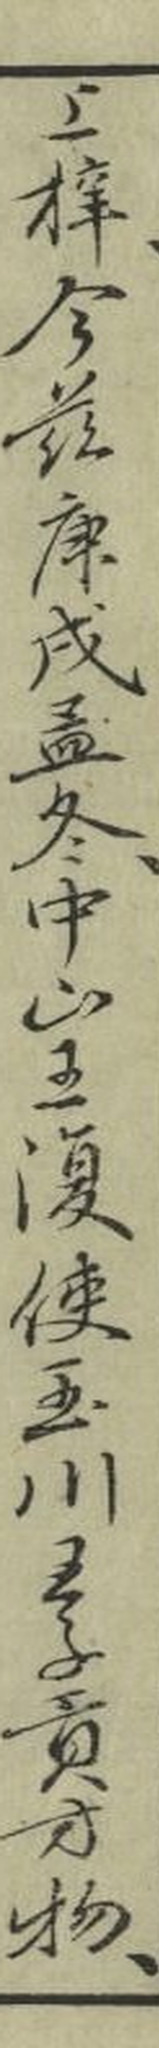上梓、今茲庚戌孟冬、中山王復使玉川王子貢方物、
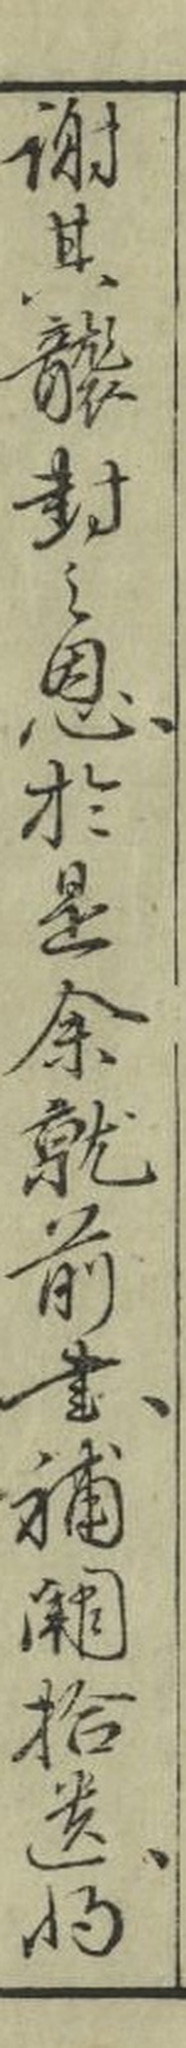謝其襲封之恩、於是余就前書、補闕拾遺、将
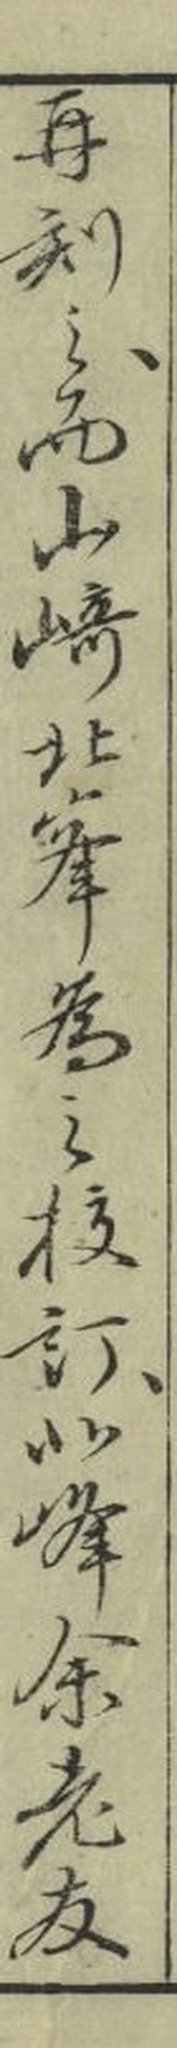再刻之、而山崎北峰為之校訂、北峰余老友
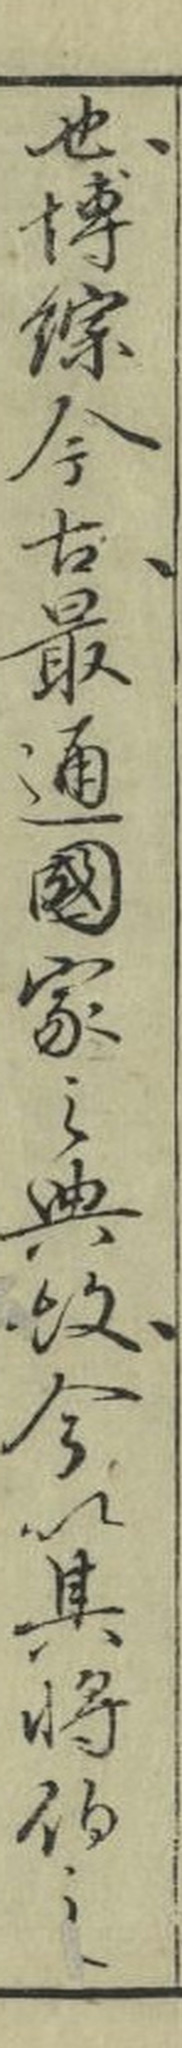也、博綜今古、最通国家之典故、今以其将伯之
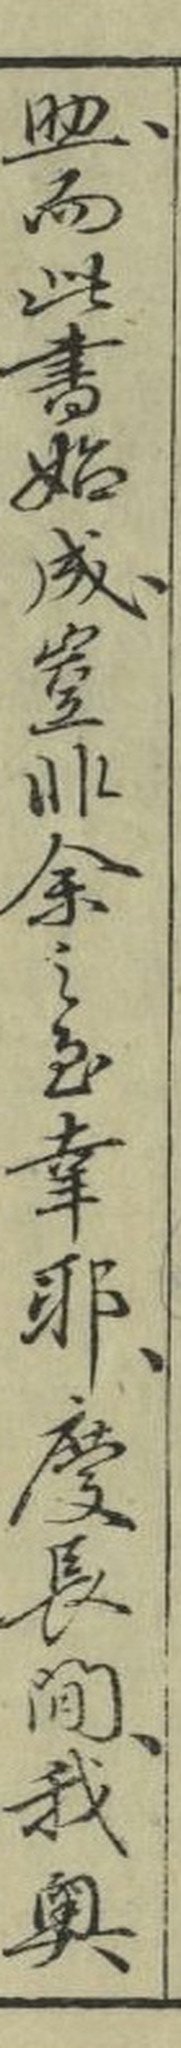助、而此書始成、豈非余之至幸耶、慶長間、我奥
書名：琉球入貢紀略
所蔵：University of the Ryukyus Library
